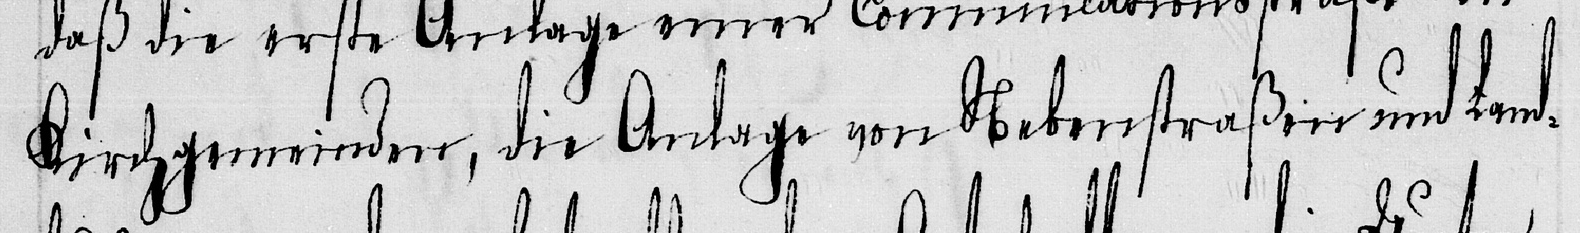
Kirchgemeinden, die Anlage von Nebenstraßen und Land¬
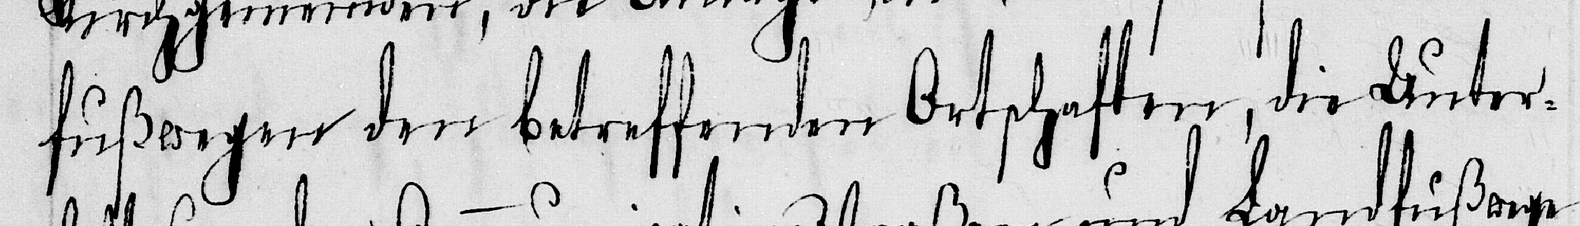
fußwegen den betreffenden Ortschaften, die Unter¬
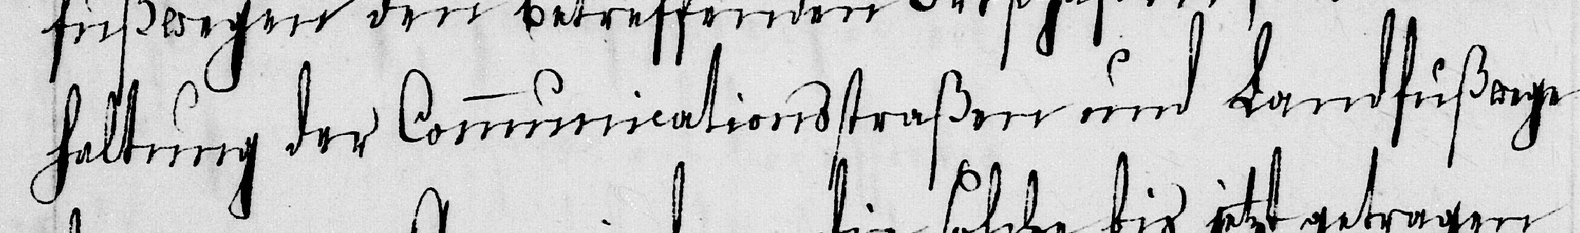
haltung der Communicationsstraßen und Landfußwege
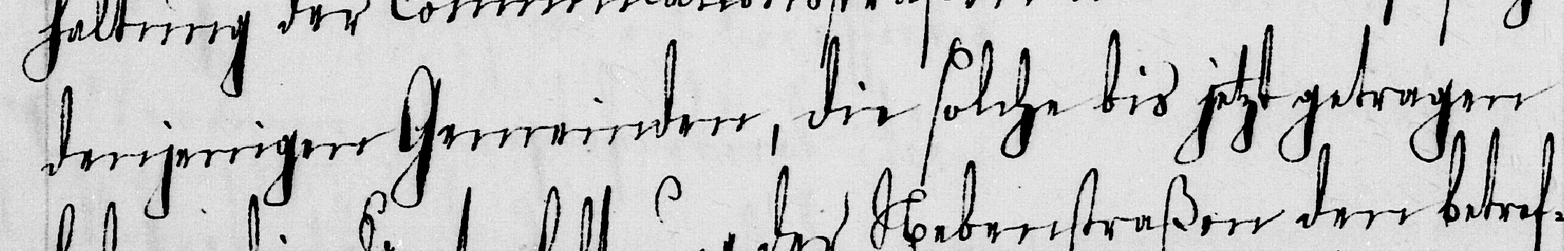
denjenigen Gemeinden, die solche bis jetzt getragen
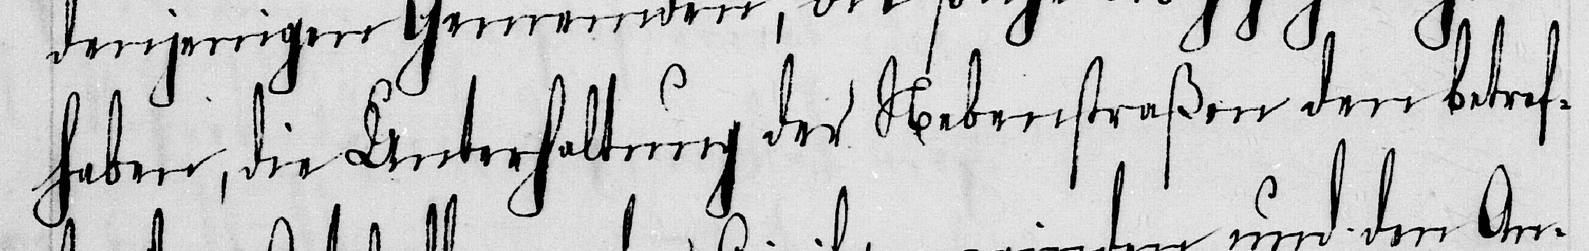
haben, die Unterhaltung der Nebenstraßen den betref¬
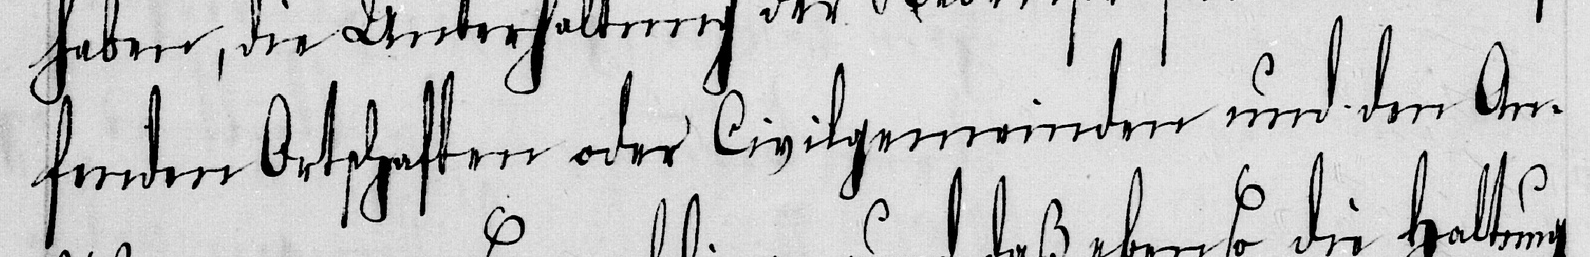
fenden Ortschaften oder Civilgemeinden und den An¬
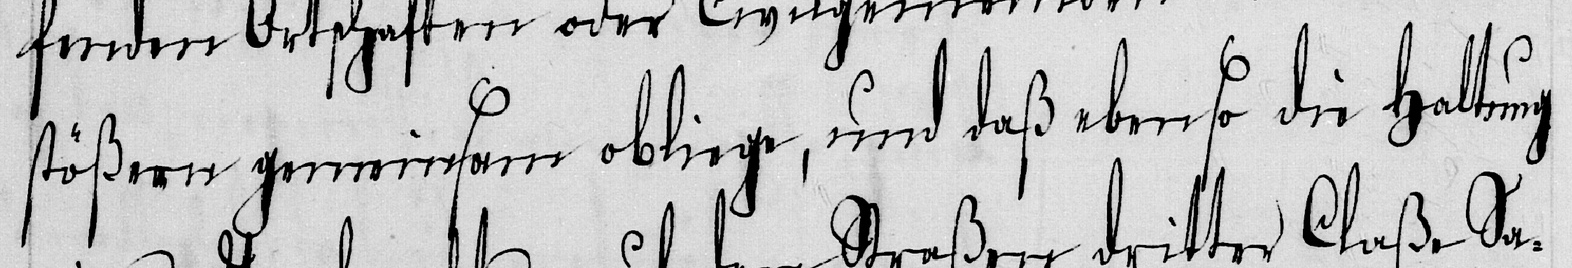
stößern gemeinsam obliege, und daß ebenso die Haltung
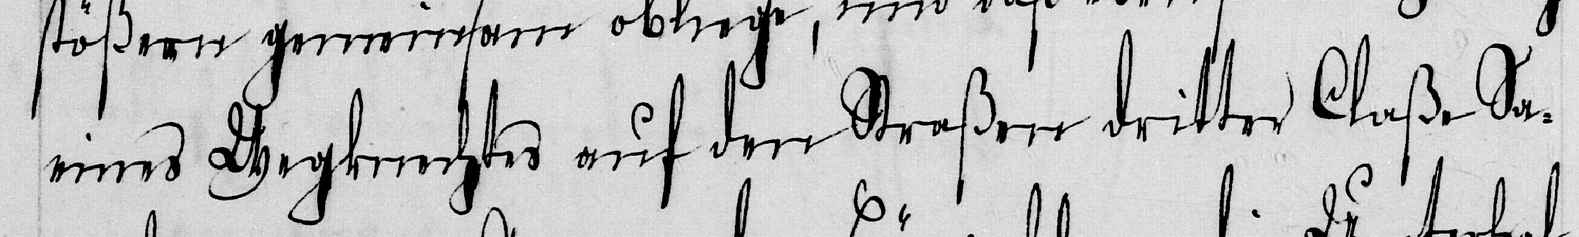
eines Wegrechtes auf den Straßen dritter Claße Sa¬
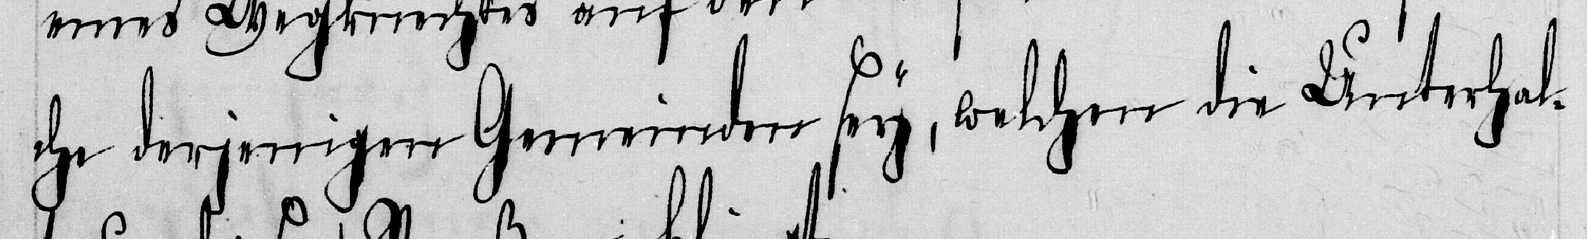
che derjenigen Gemeinden sey, welchen die Unterhal¬
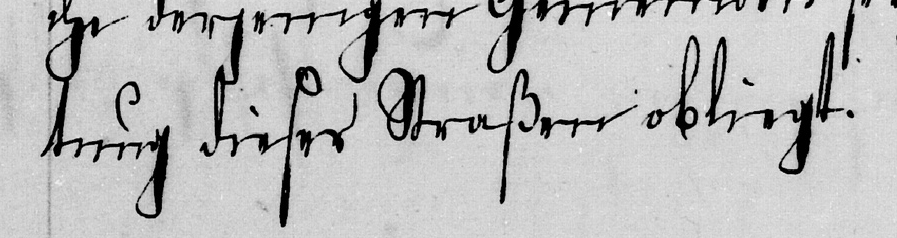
tung dieser Straßen obliegt.
